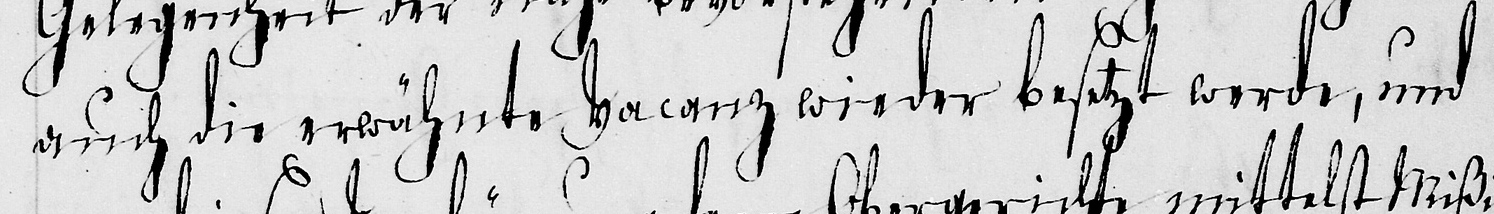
auch die erwähnte Vacanz wieder besetzt werde, und
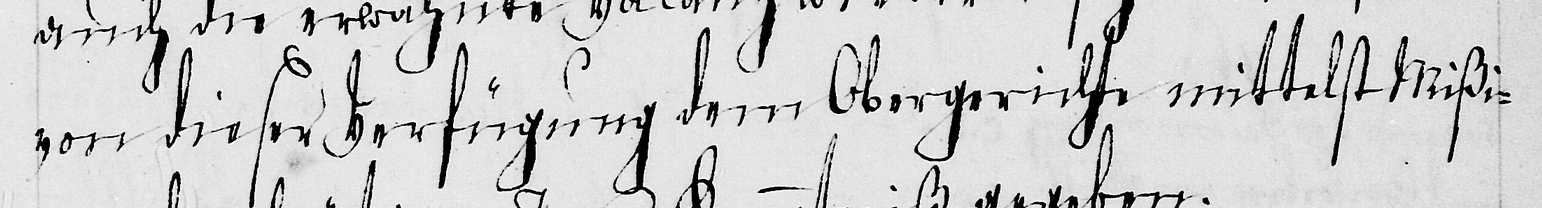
von dieser Verfügung dem Obergerichte mittelst Mißi¬
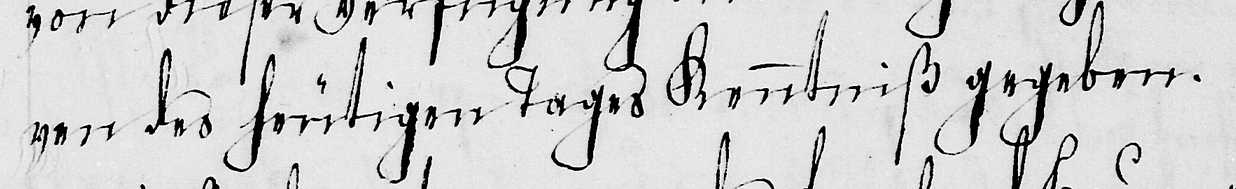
ven des heutigen Tages Kenntniß gegeben.
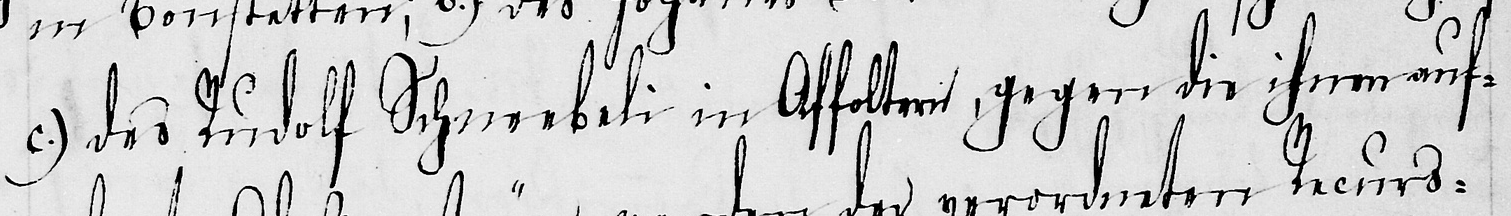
des Rudolf Schneebeli in Affoltern, gegen die ihnen auf¬
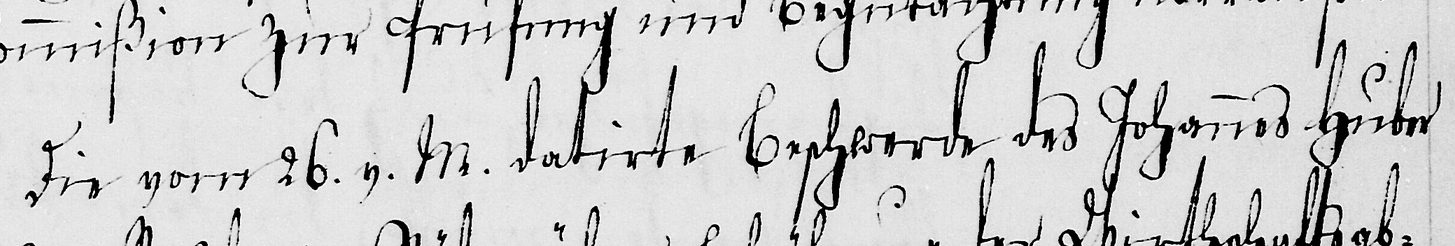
Die vom 26. v. M. datirte Beschwerde des Johannes Huber
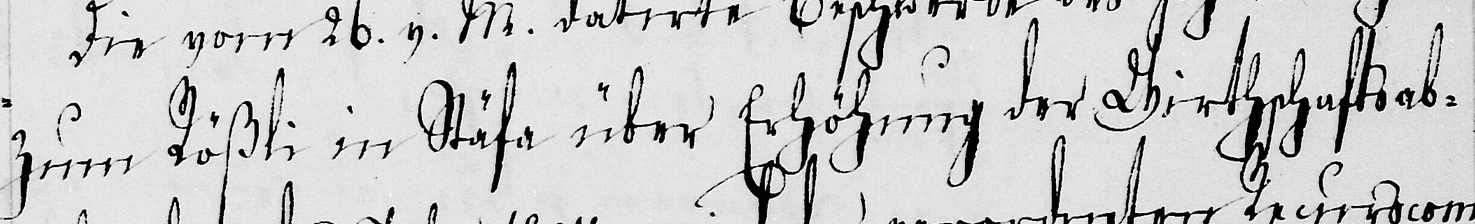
zum Rößli in Stäfa über Erhöhung der Wirthschaftsab¬
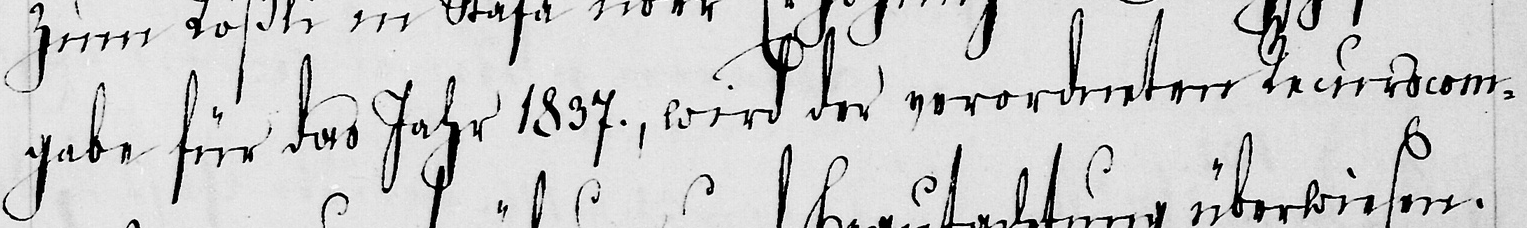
gabe für das Jahr 1837., wird der verordneten Recurscom¬
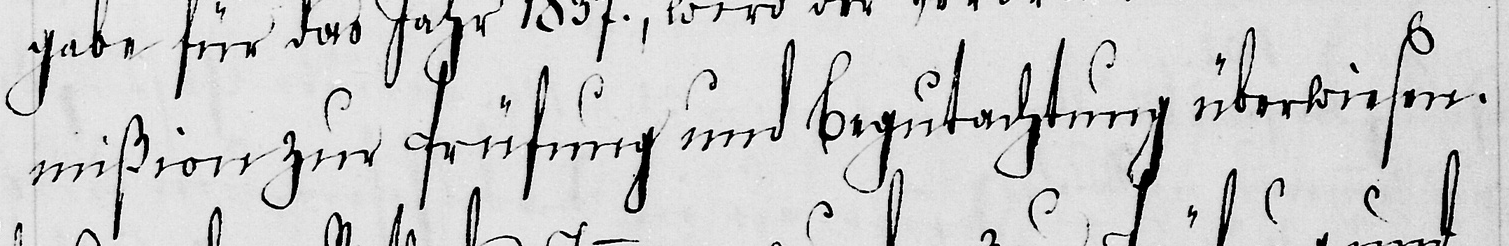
mißion zur Prüfung und Begutachtung überwiesen.
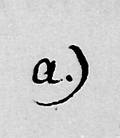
c.)
